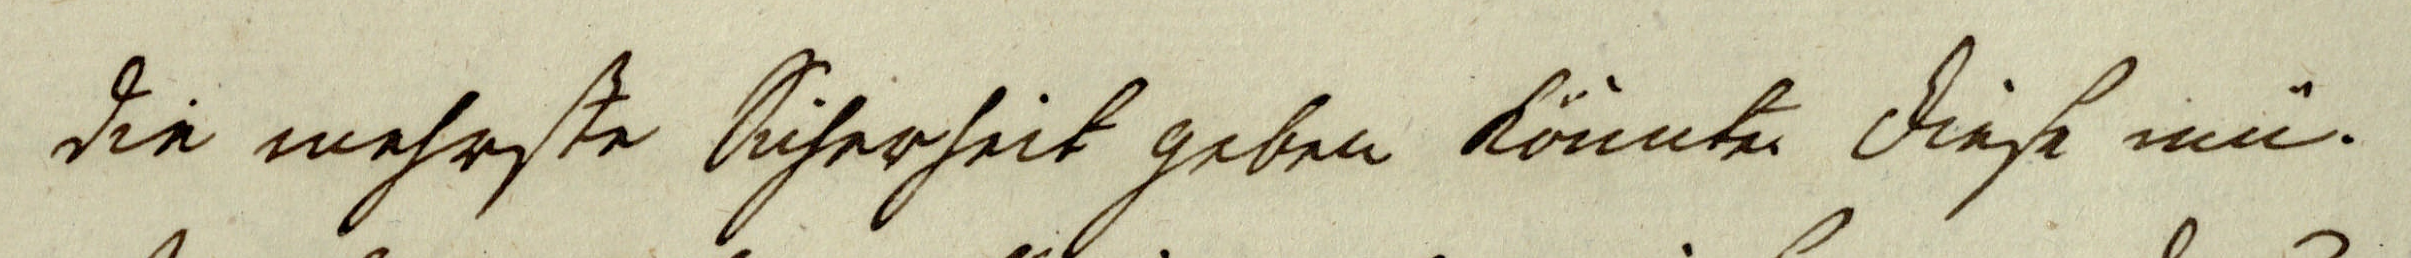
die mehrste Sicherheit geben könnte. Diese mü¬
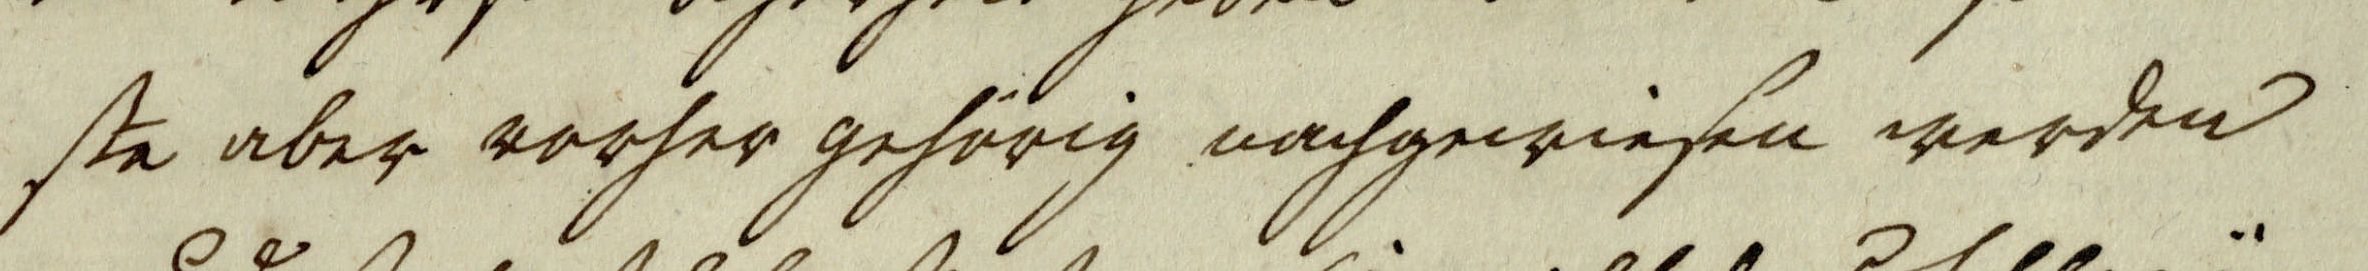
ste aber vorher gehörig nachgewiesen werden
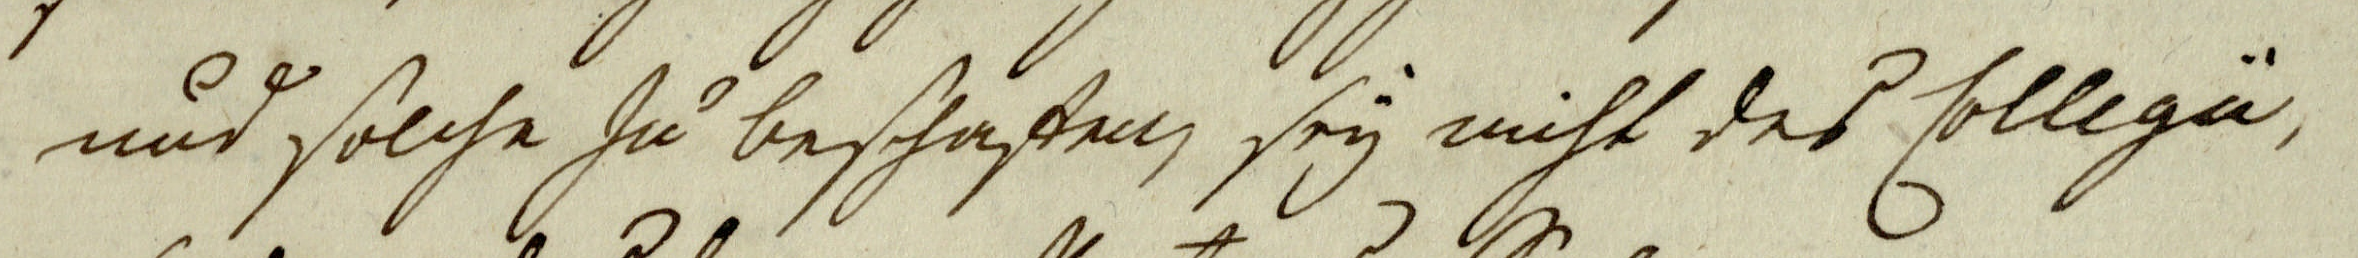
und solche zu beschaffen, seÿ nicht des Collegii,
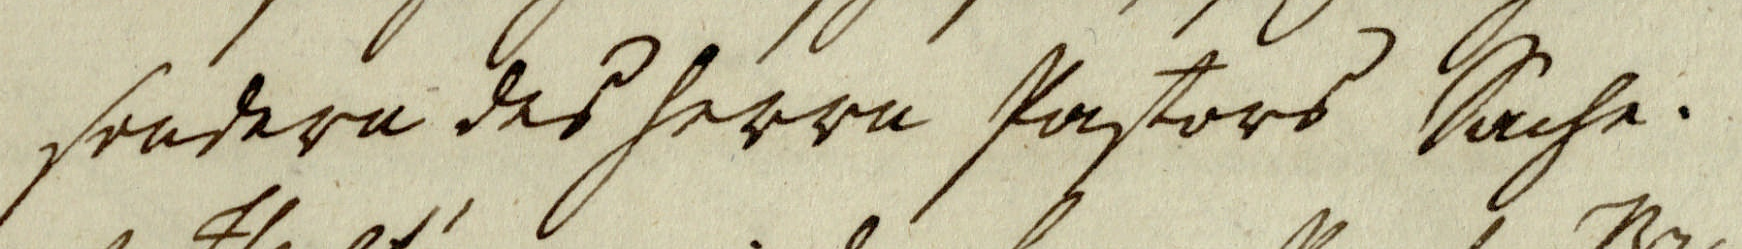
sondern des Herrn Pastors Sache.
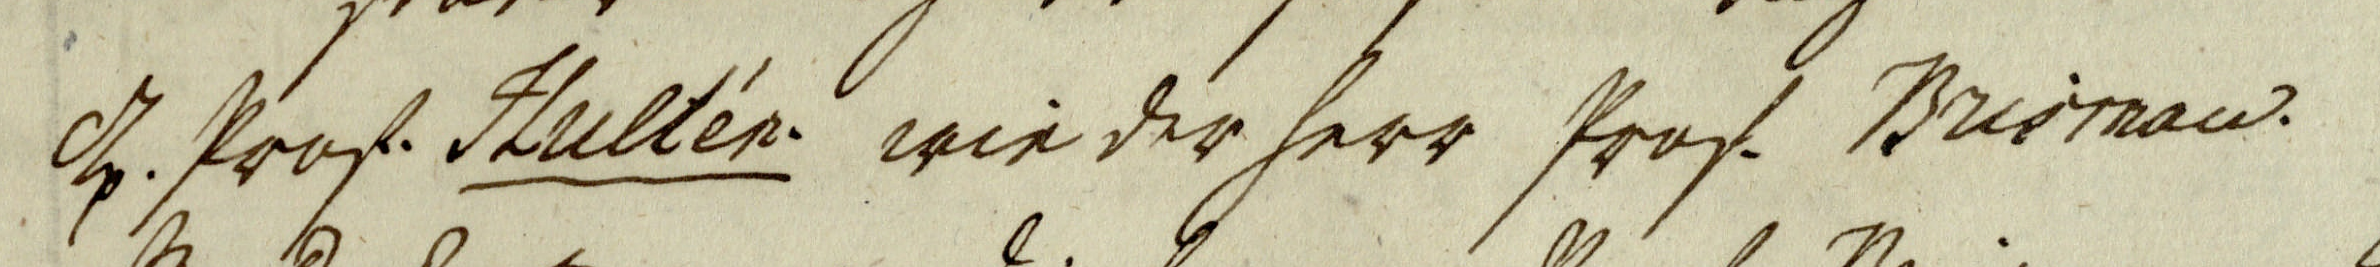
dh. Prof. Hultén wie der Herr Prof. Brisman.
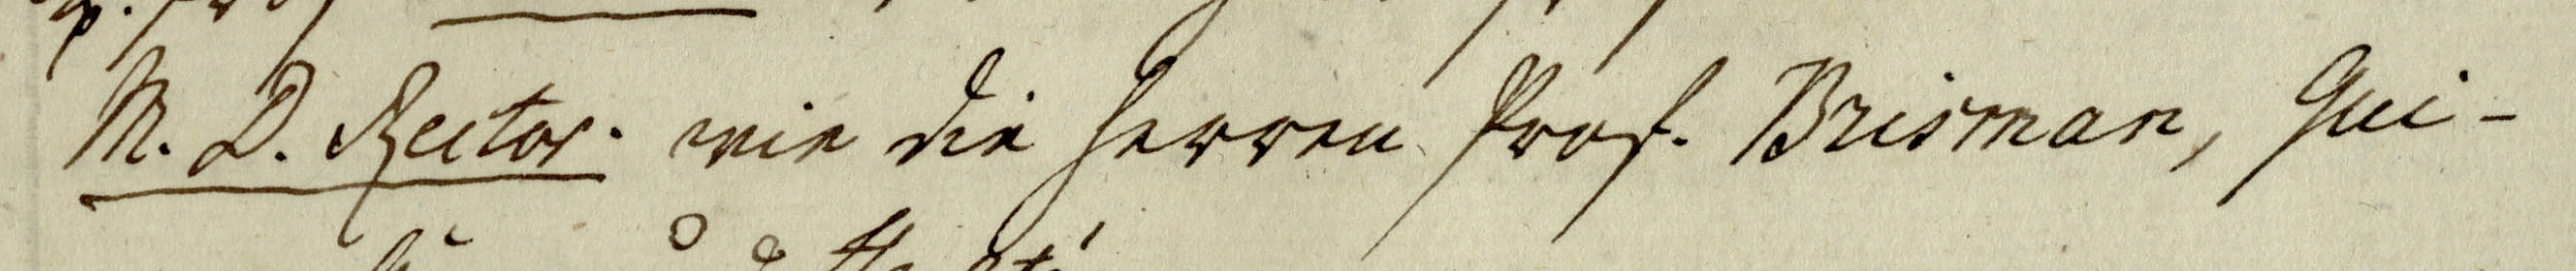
M. D. Rector. wie die Herren Prof. Brisman, Qui-
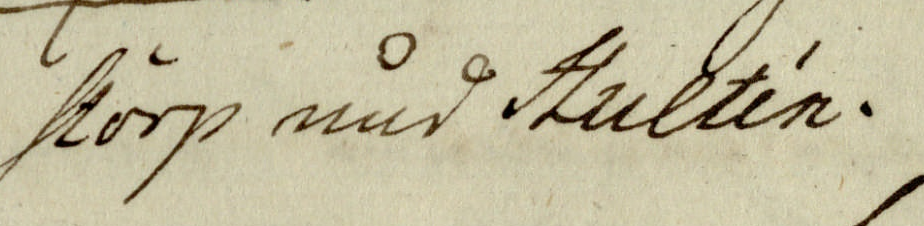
storp und Hultén.
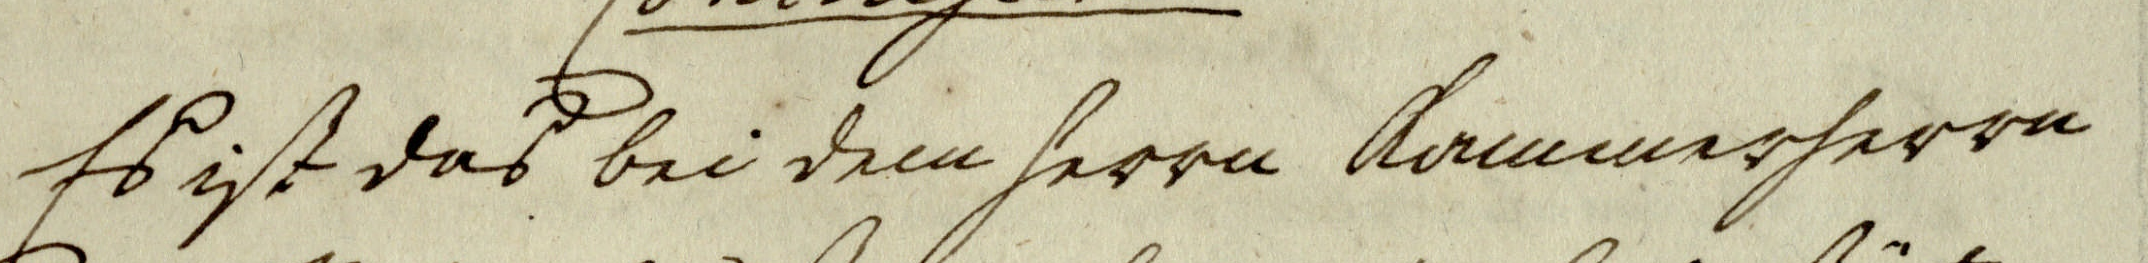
Es ist das bei dem Herrn Kammerherrn
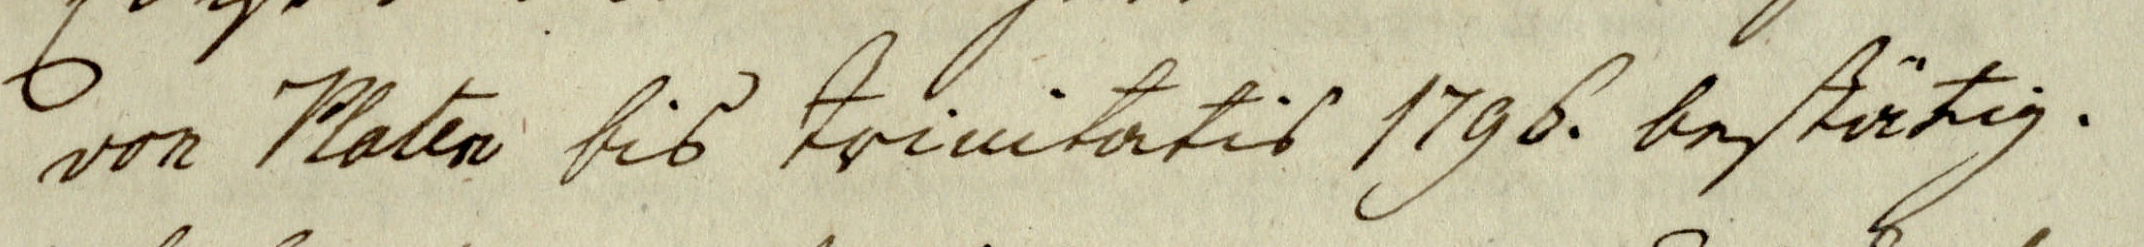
von Platen bis Trinitatis 1796. bestätig¬
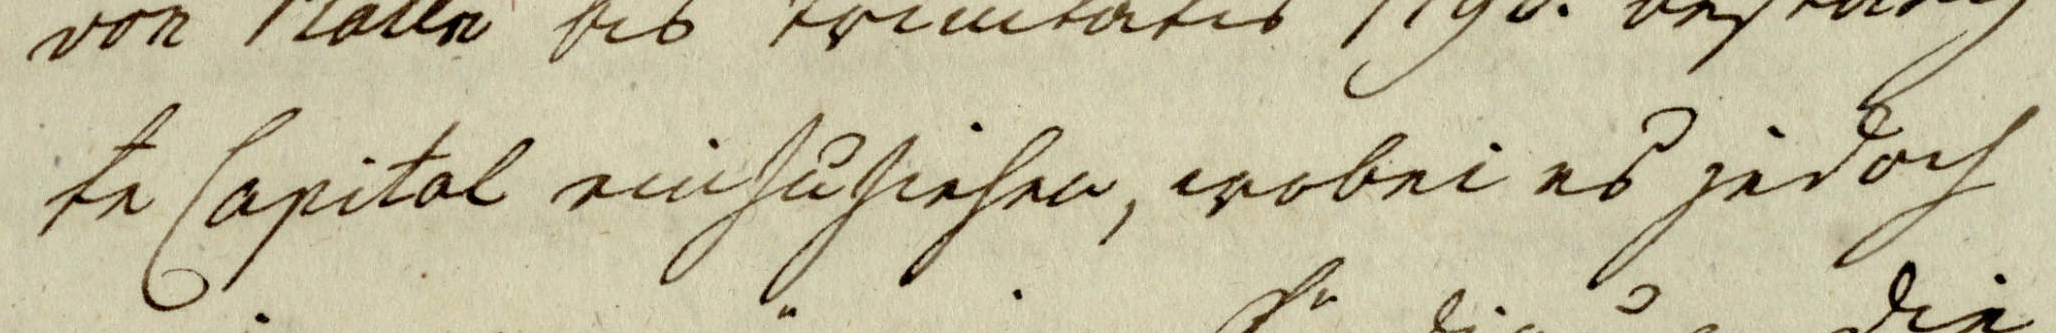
te Capital einzuziehen, wobei es jedoch
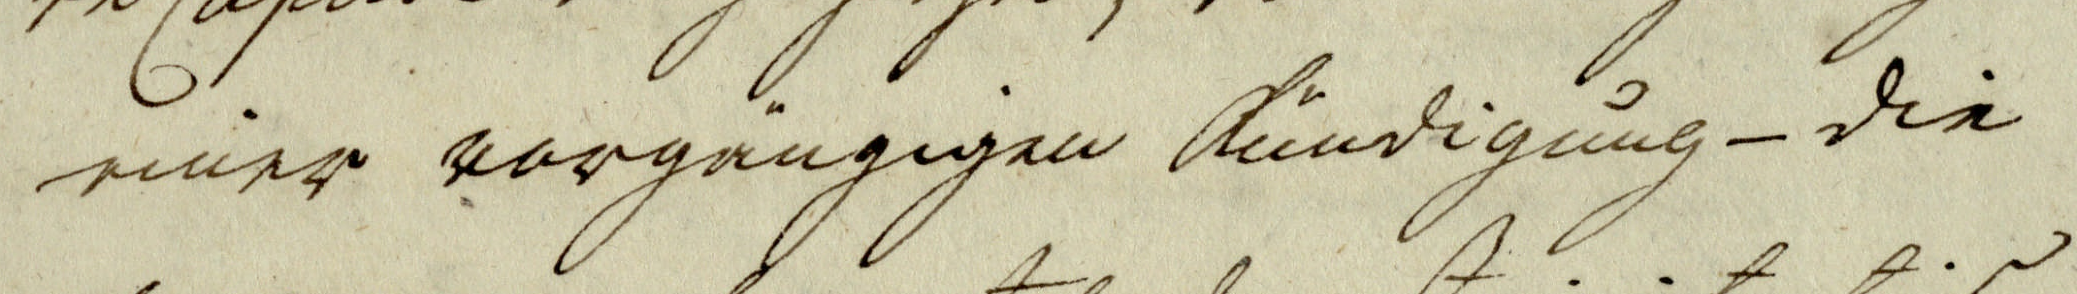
einer vorgängigen Kündigung die
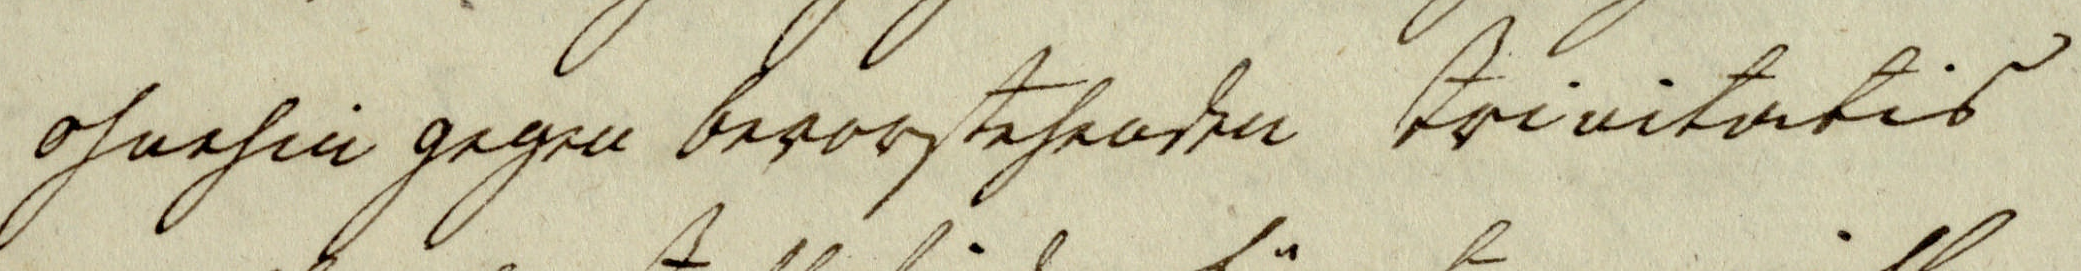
ohnehin gegen bevorstehenden Trinitatis
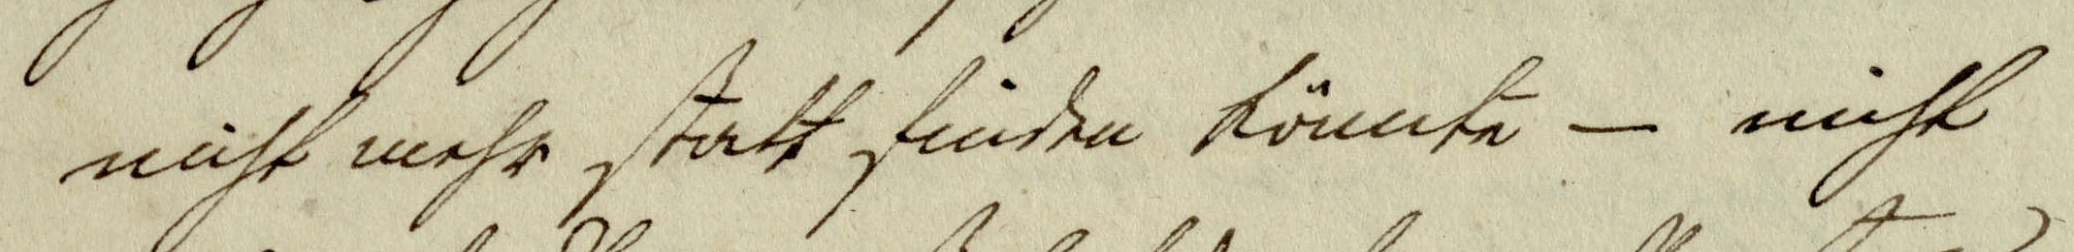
nicht mehr statt finden könnte nicht
